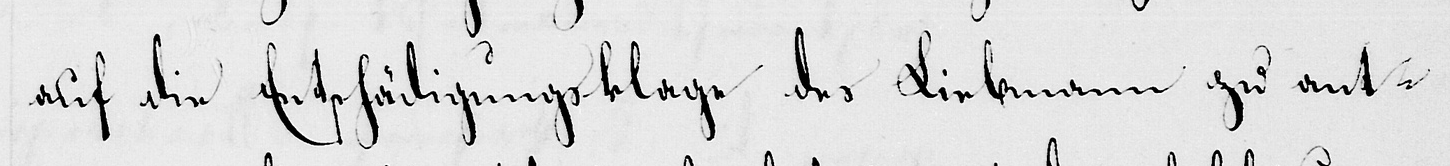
auf die Entschädigungsklage des Liebmann zu ant¬
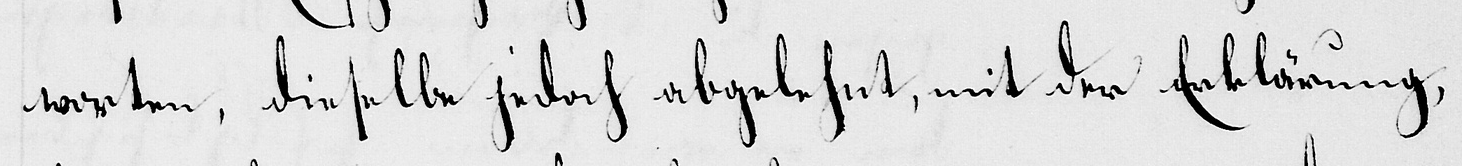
worten, dieselbe jedoch abgelehnt, mit der Erklärung,
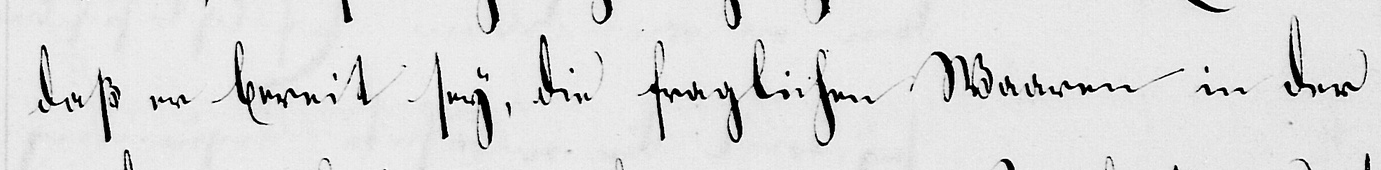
daß er bereit sey, die fraglichen Waaren in der
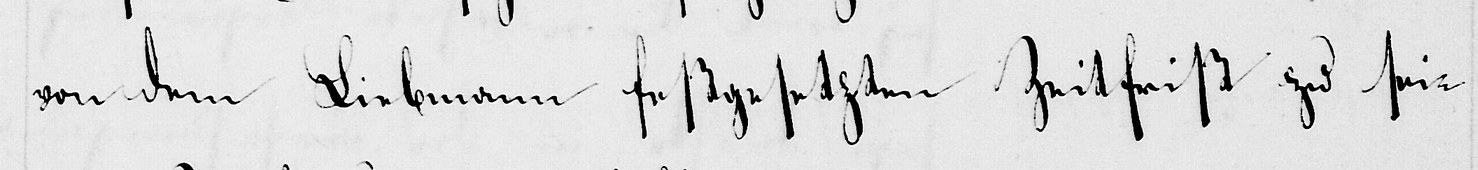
von dem Liebmann festgesetzten Zeitfrist zu sei¬
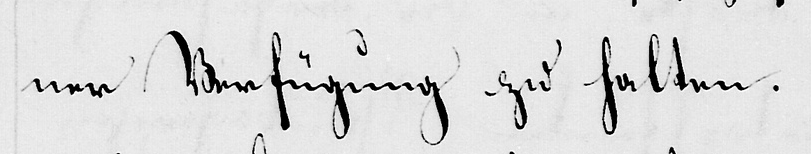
ner Verfügung zu halten.
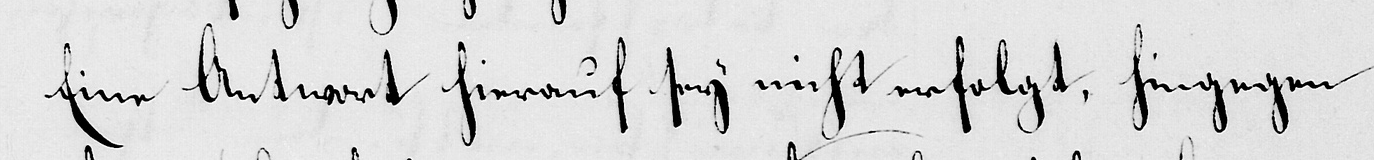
Eine Antwort hierauf sey nicht erfolgt, hingegen
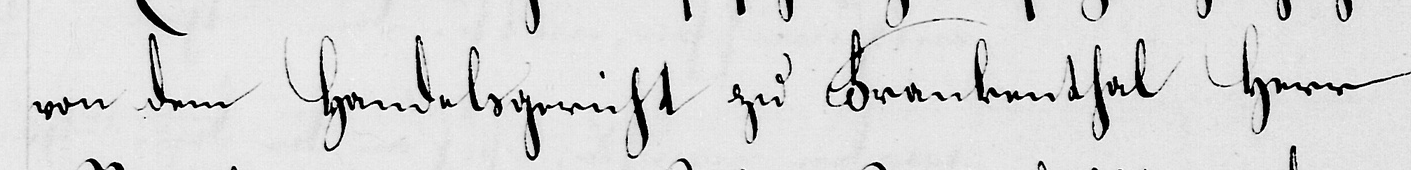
von dem Handelsgericht zu Frankenthal Herr
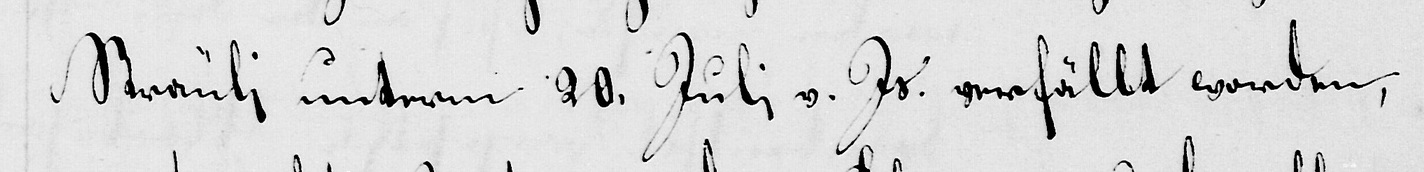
Sträuli unterm 20. Juli v. Js. verfällt worden,
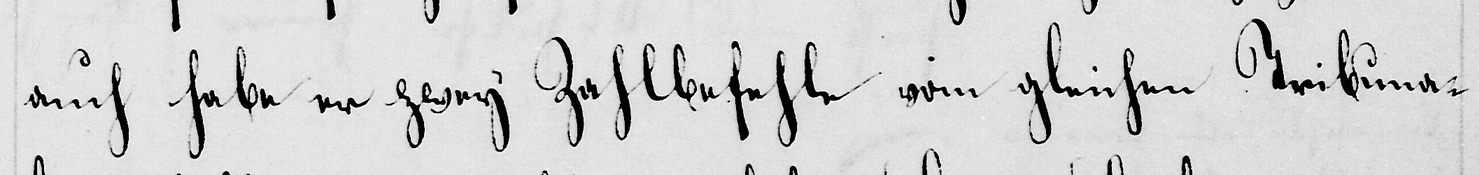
auch habe er zwey Zahlbefehle vom gleichen Tribuna¬
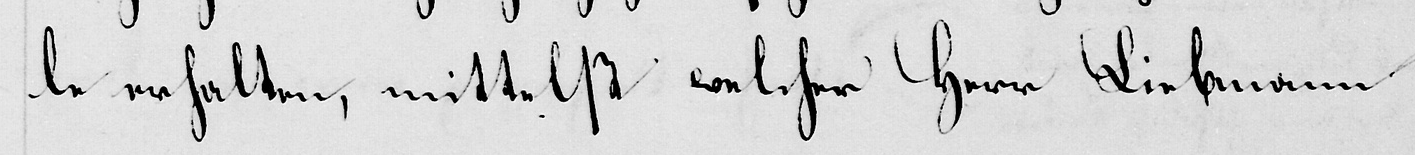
le erhalten, mittelst welcher Herr Liebmann
